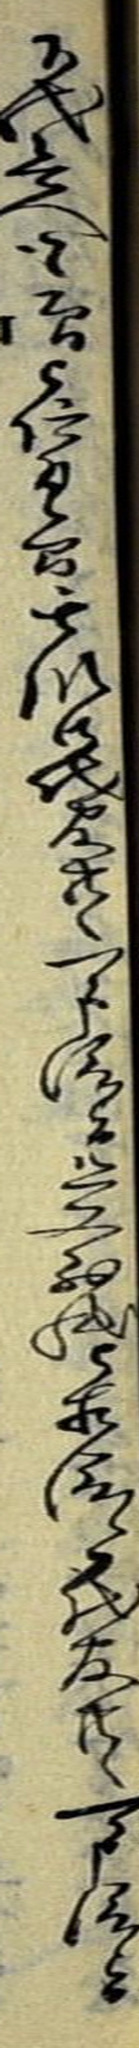下代壱人ツヽ増被仰付候間其段御代官共へ可申渡旨且又別紙被相渡候御代官共へ可申渡旨
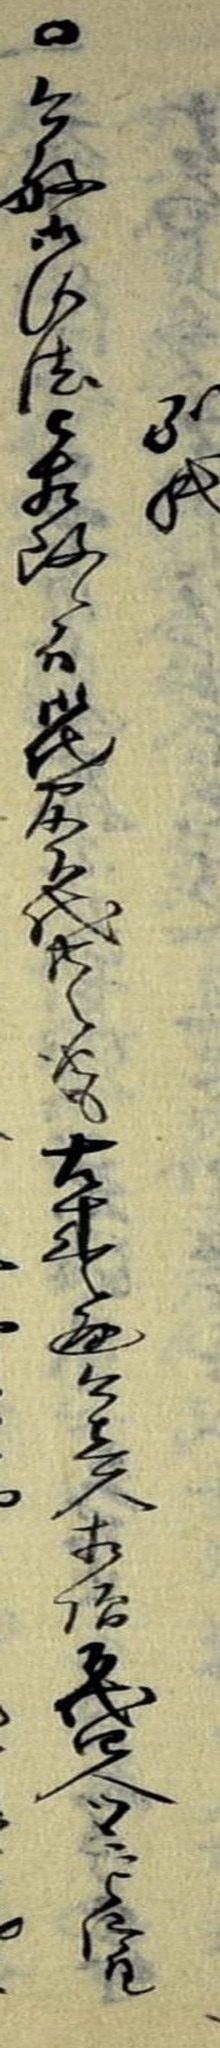〇今般御趣法被相改候に付御代官下代共之儀も古来之通今壱人相増下代四人ツヽに被仰付候
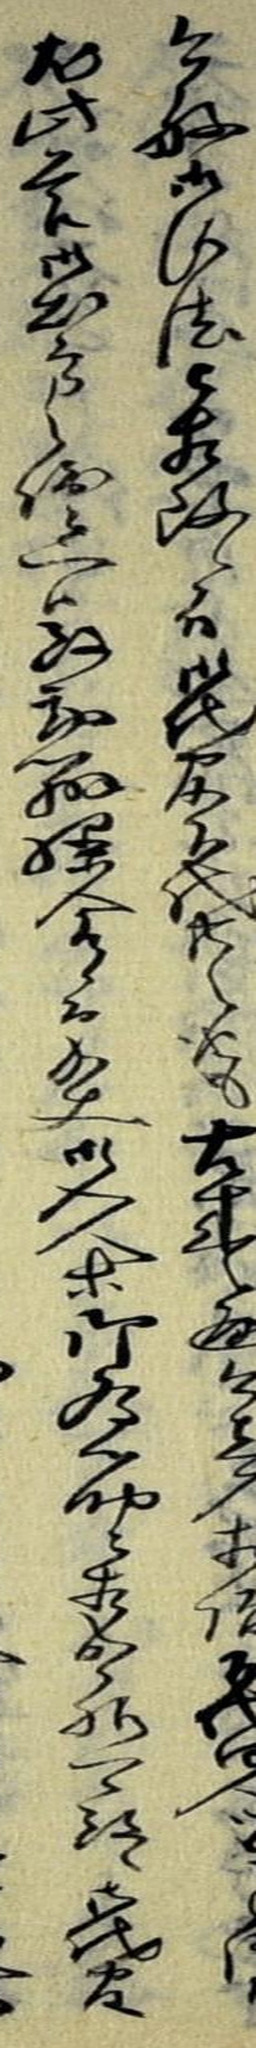尤此節御出方之儀に候へは致勘弁繰合候而成丈御等御為筋に相成候様可致候御代官
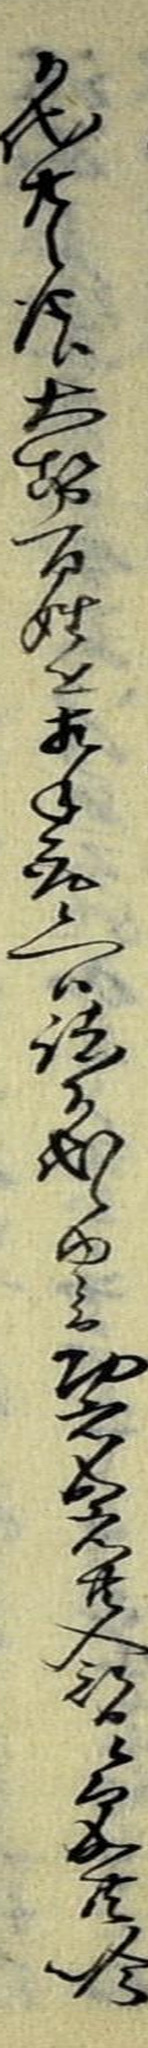下代共之儀は大勢百姓を相手取候へは諸下代之内に而功者成者共入替候而成共吟
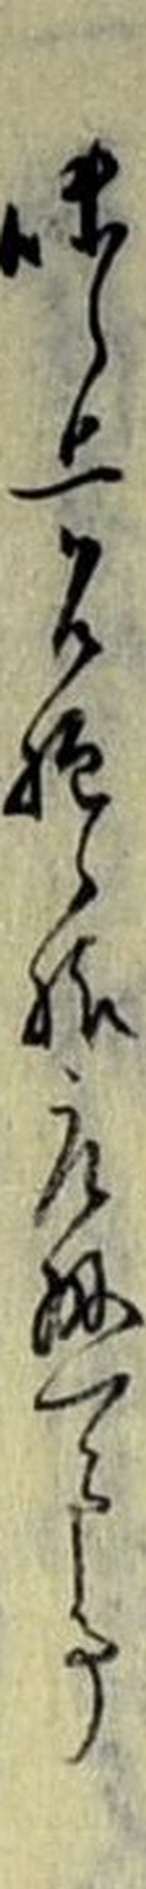味之上召抱候様取扱可申事
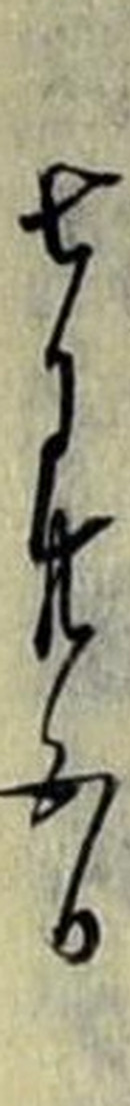七月廿五日
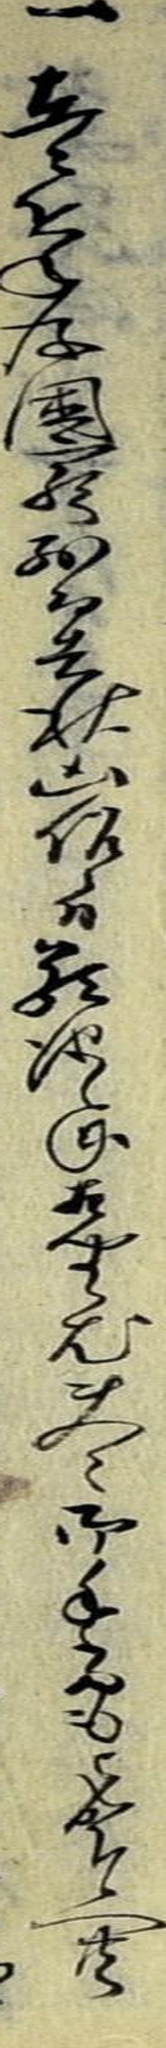一在々近年及困窮別而去秋凶作に付難儀之趣相聞候尤夫々御手当も被成下候へ共
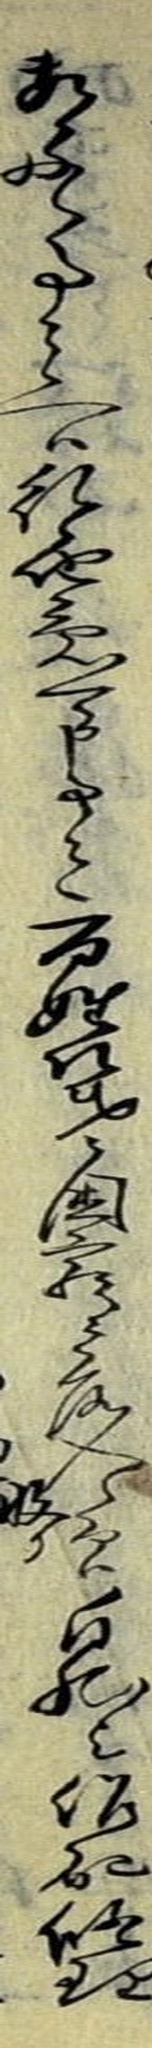数多之事に候へは行届兼可申事に候百姓次第に困窮に落入候而は自然与作配修理
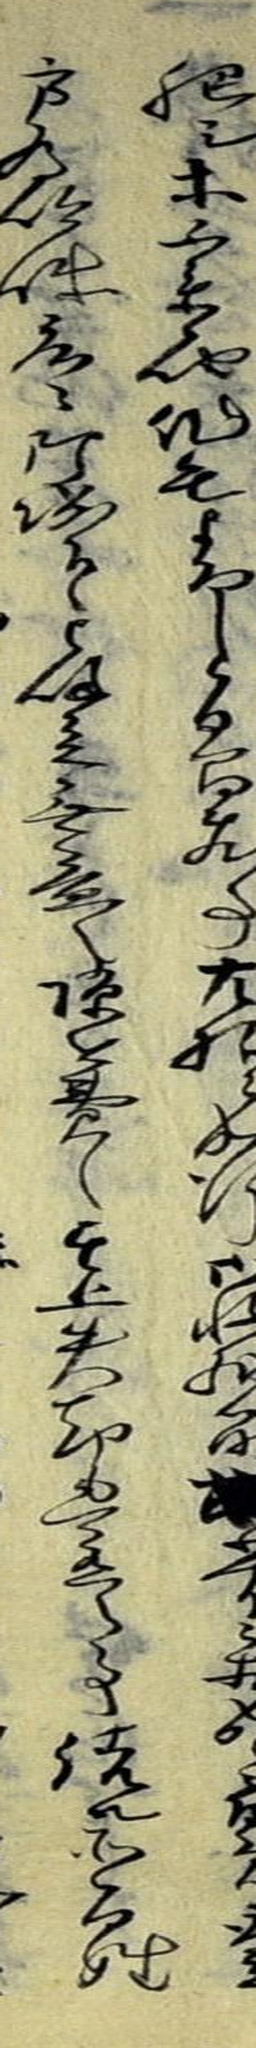方為吟味度々御城下へ被呼立無益之隙を費し其上失却も可有之事詰る所百姓
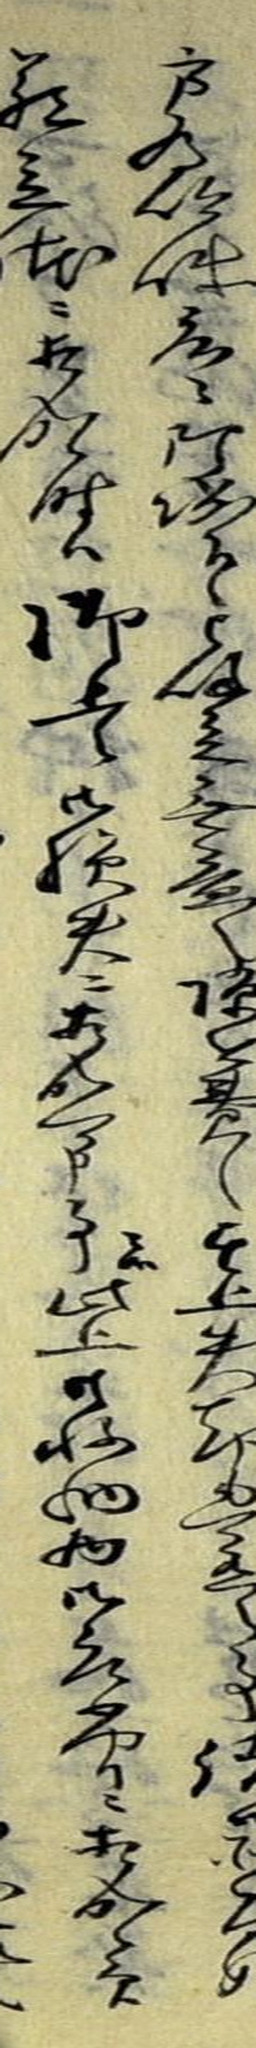難立体に相成候時は御上之御損失に相成可申事に候此上御収納物御取劣りに相成候而は
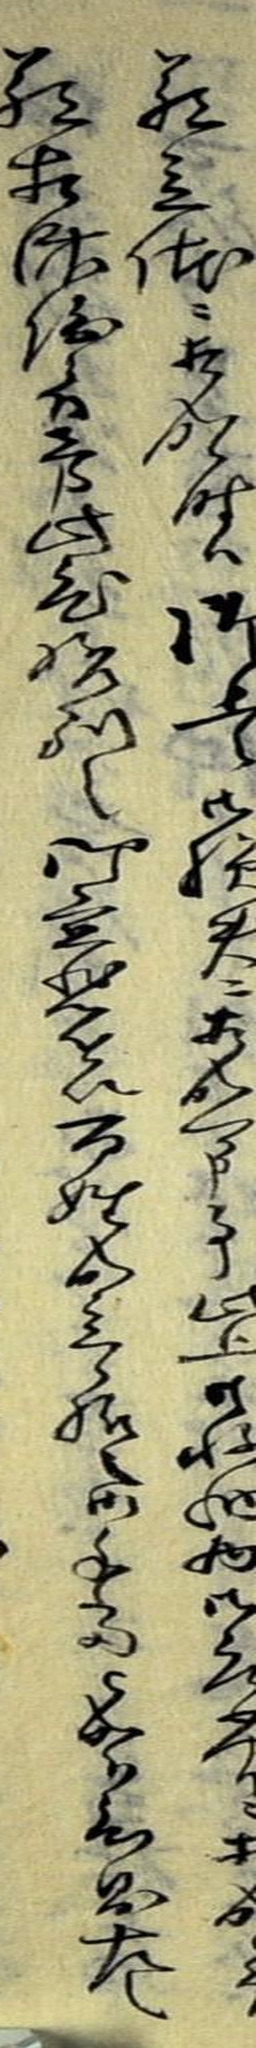難相済儀に付旁此度格別之御慈悲を以百姓成立候様之御手当被成下度則左之
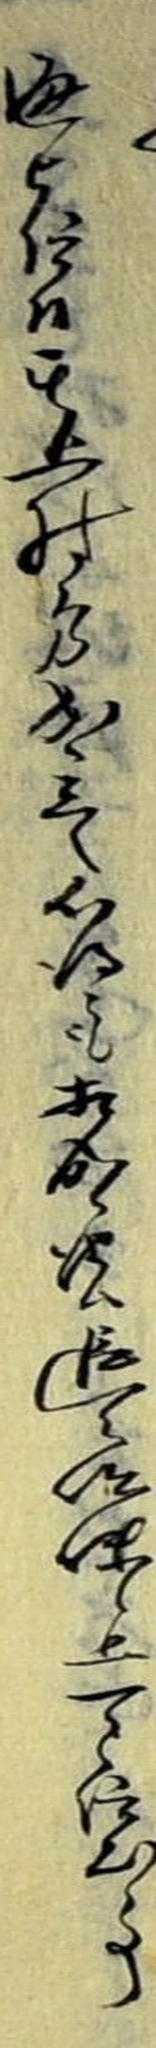通被仰付其上村方成立之心得にも相成候儀は追々吟味之上可被仰出候事

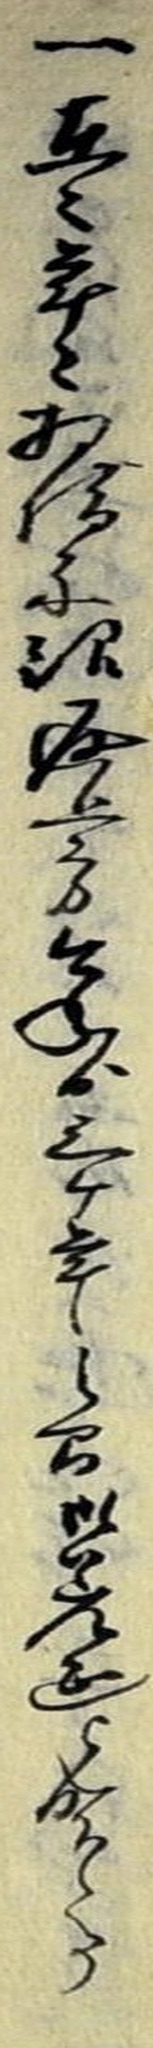一在々年々拝借米銀返上方今年ゟ三ヶ年之間御差延被成下候事
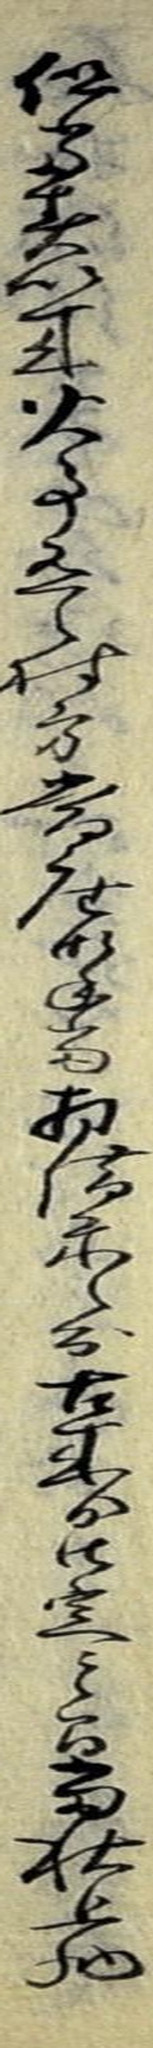但当春以来火事有之村方当座御手当拝借米之分古来ゟ御定に候間当秋上納
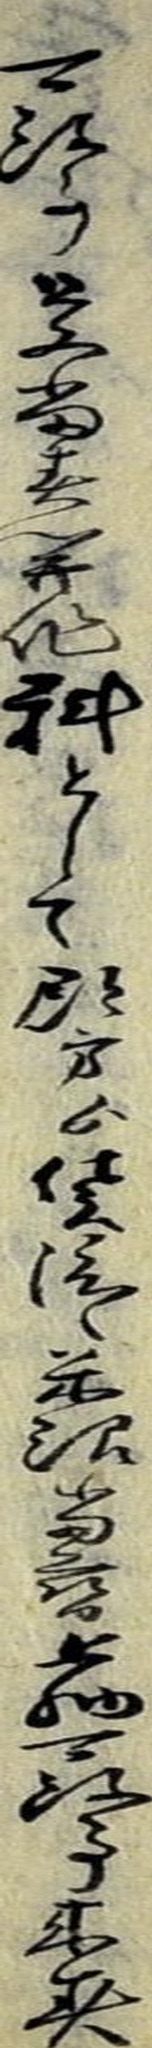可致事且又当春開作料として郡方ゟ貸渡候米銀当暮上納可致事来春
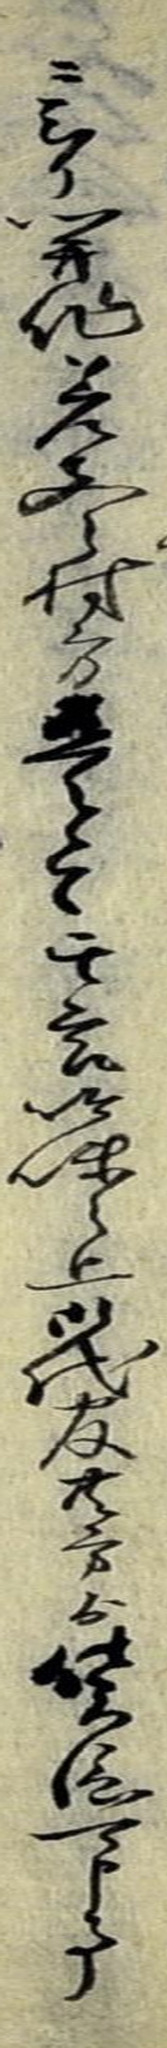に至り開作差支之村方有之候はゝ其節吟味之上御代官共方ゟ貸渡可申事
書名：命令之部 二
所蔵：福井県文書館 Fukui Prefectural Archives
